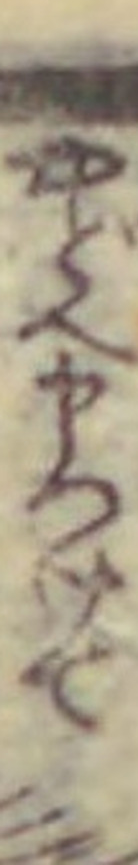やどへ申つけて
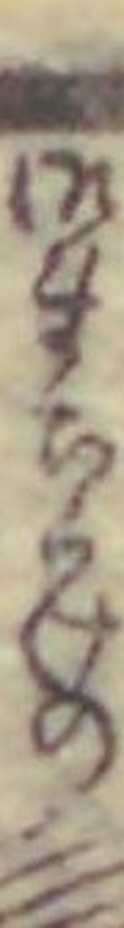御まちうけの
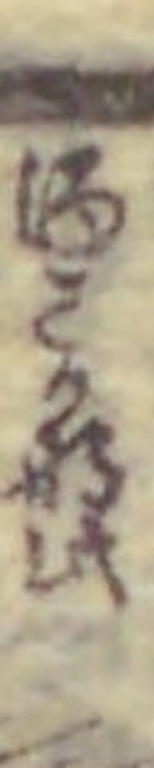酒さかな此
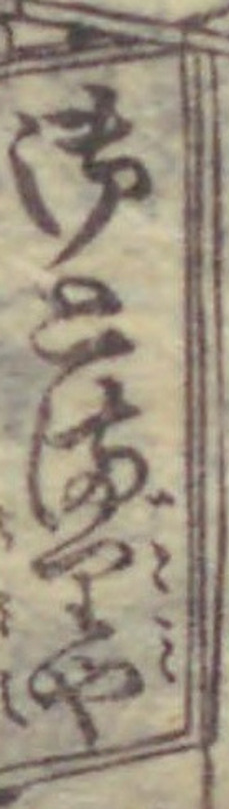御とまりや
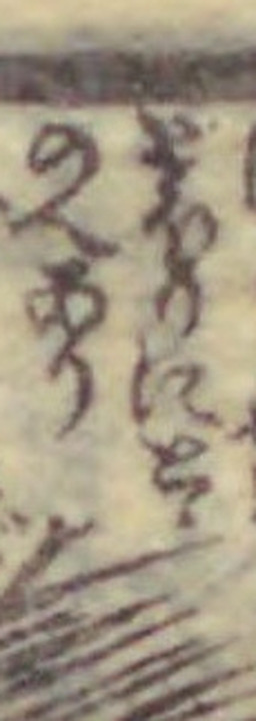のへあり
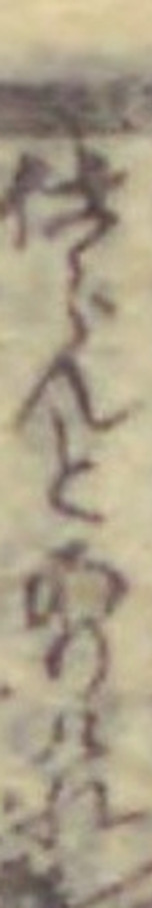仕らんとありけれ
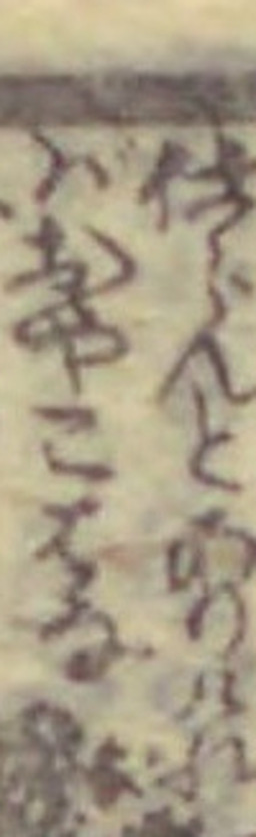ばおやこはな
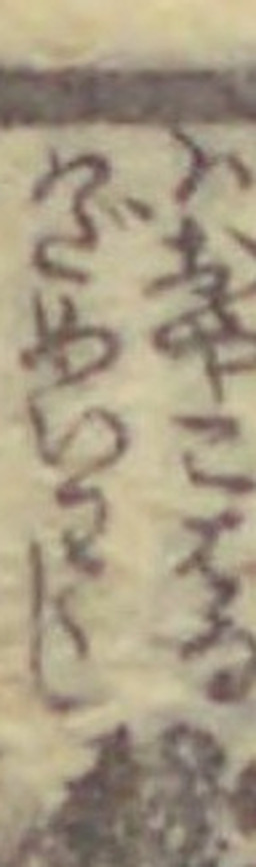はだめいわくし
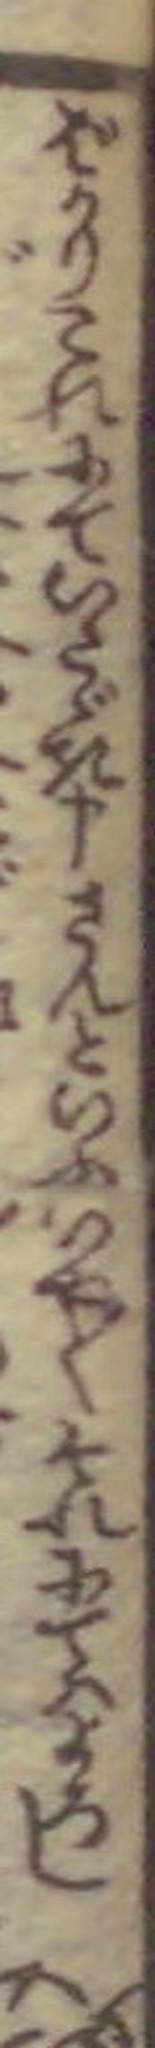ばかりこれにていたゞき申さんといふいや〳〵それにてよろし
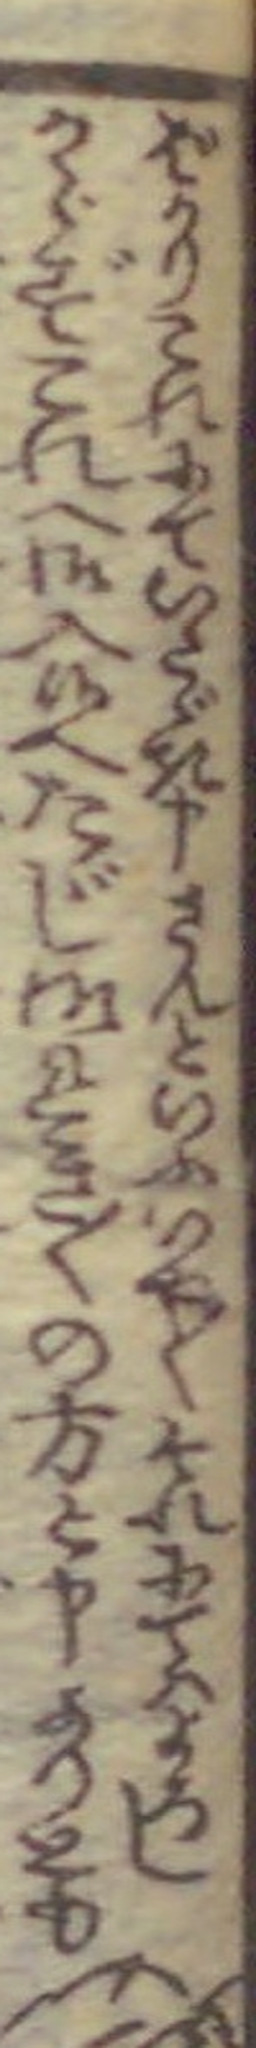からずこれへ御入候へたゞし御れき〳〵の方と申よりとも
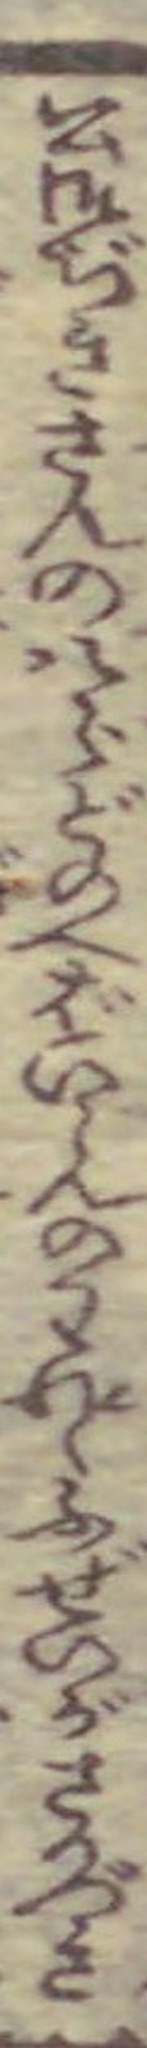公御ぢきさんの八郎どのへばいしんのわれ〳〵ふぜいがさかづき
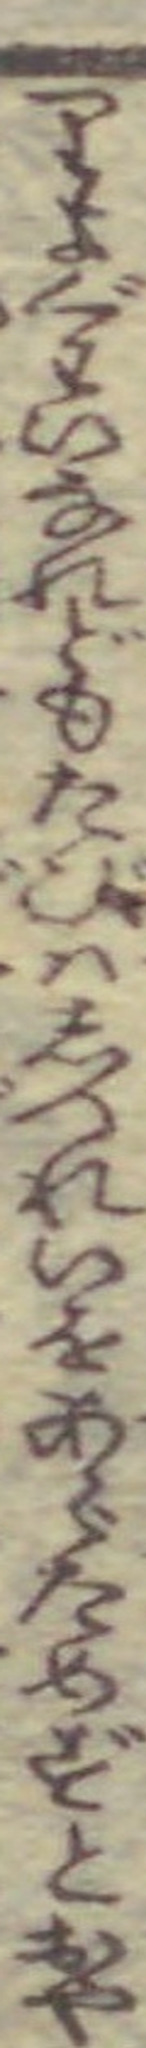りよぐわいなれどもたびはしつれいをあらためずとおや
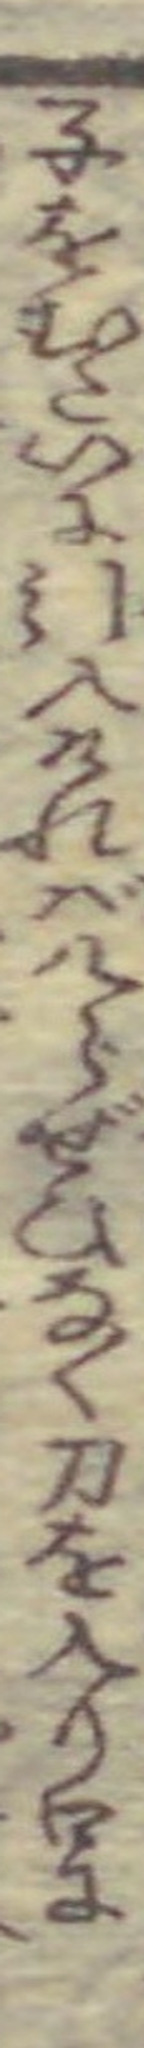子をむたいに引入ければ八郎ぜひなく刀を入り口に
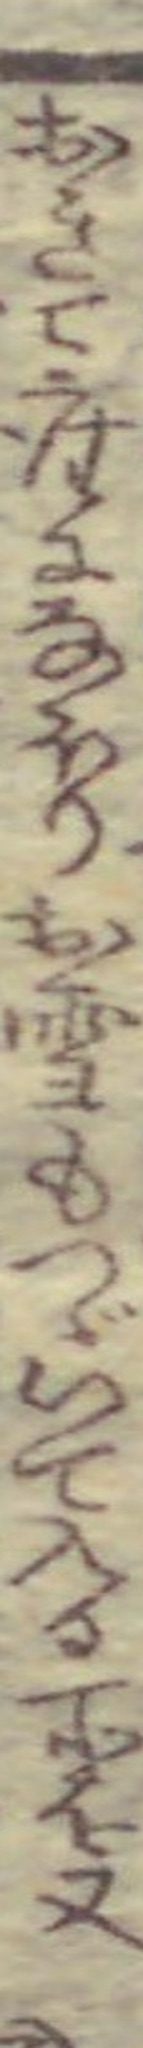おきて座になほりお雪もつゞいて入る所を又
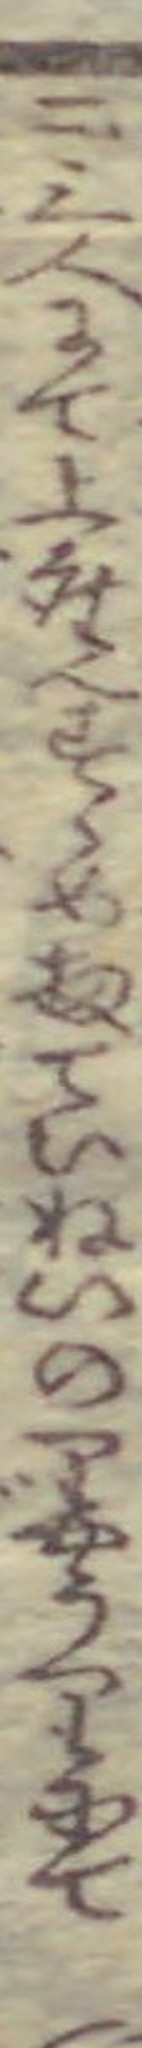二三人にて上座へすゝめ扨ていねいのりやうりにて
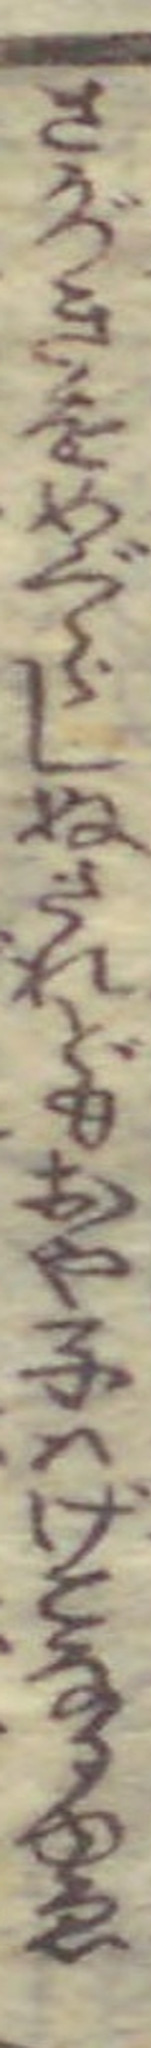さかづきをめぐらしぬされどもおや子はげこなるゆゑ
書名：八ツ目鱣因縁物語 3巻
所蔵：国立国会図書館 National Diet Library, JAPAN
